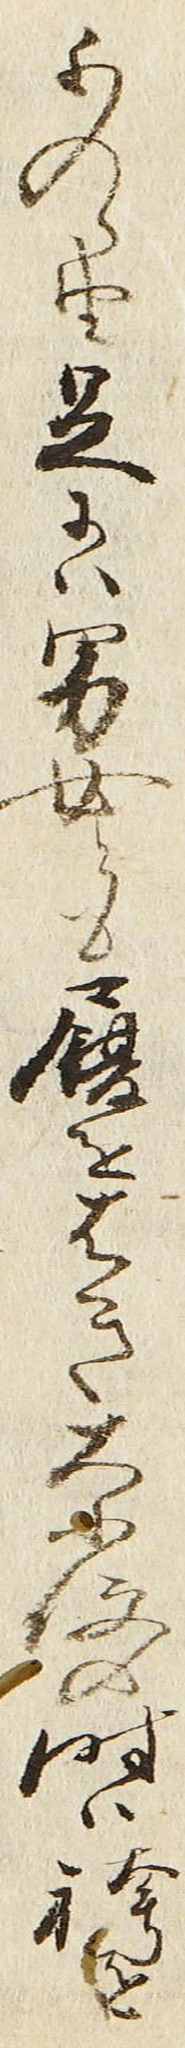ものの由足にハ男女とも履をはき大小便の時ハ袴を
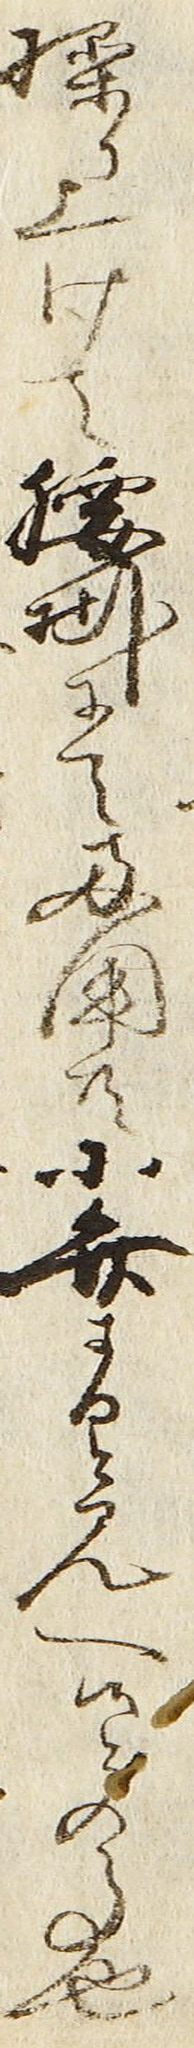操り上けて腰掛にて両用共小弁すると見へ候との事也
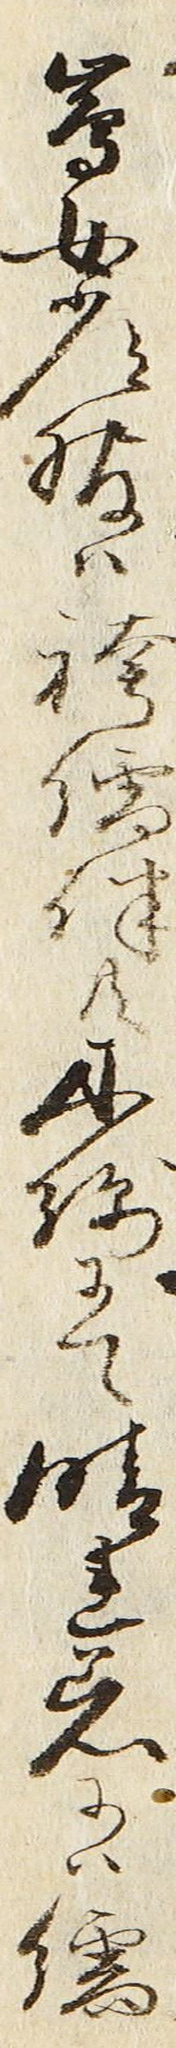島女常服ハ袴繻伴共木綿にて晴れ着にハ繻
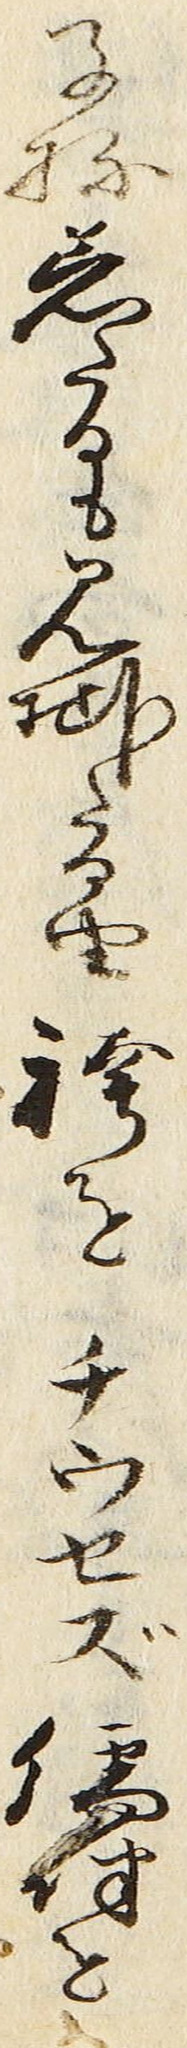子抔着たるも見掛たる由袴をチウセズ繻伴を
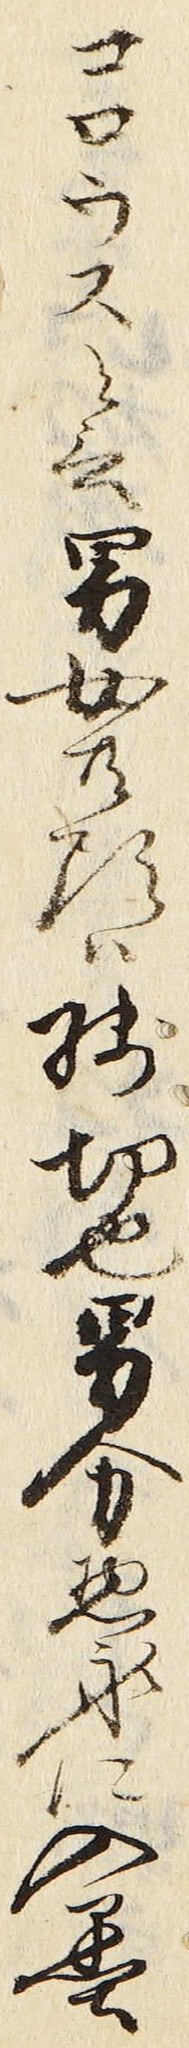コロウスと言男女共頭ハ残切也男分惣身に入墨
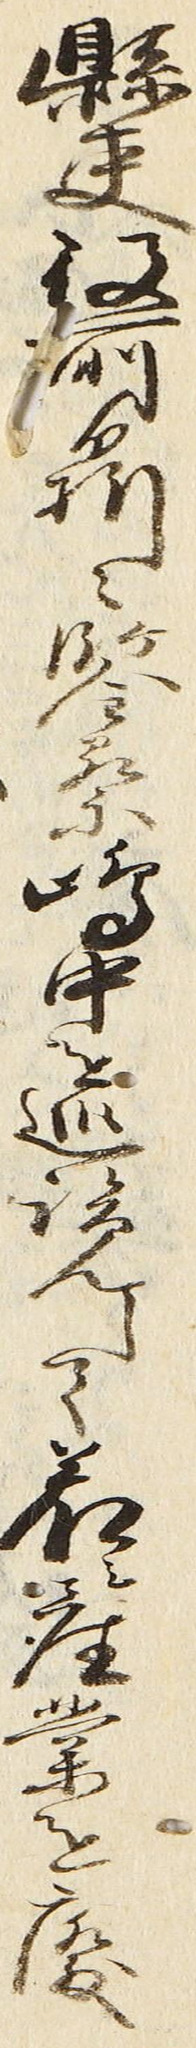県吏役所ゟ折々鑑察島中を巡覧して若シ産業を廃
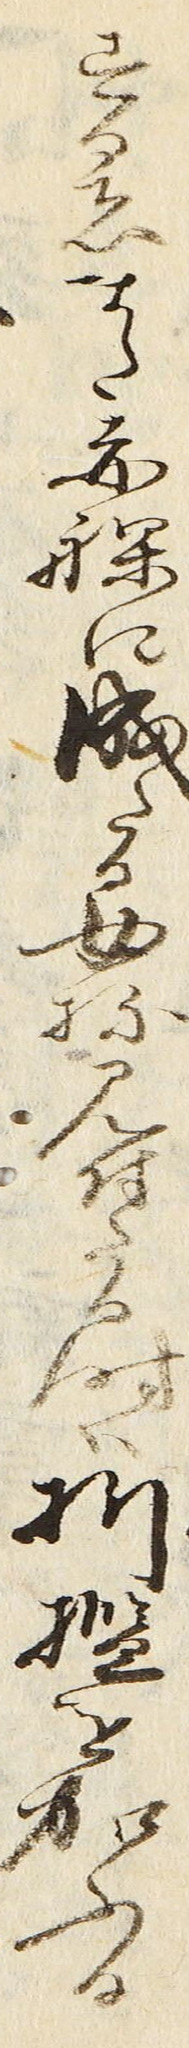する者また赤裸に成たる女抔見付たる時ハ折檻を加ふる
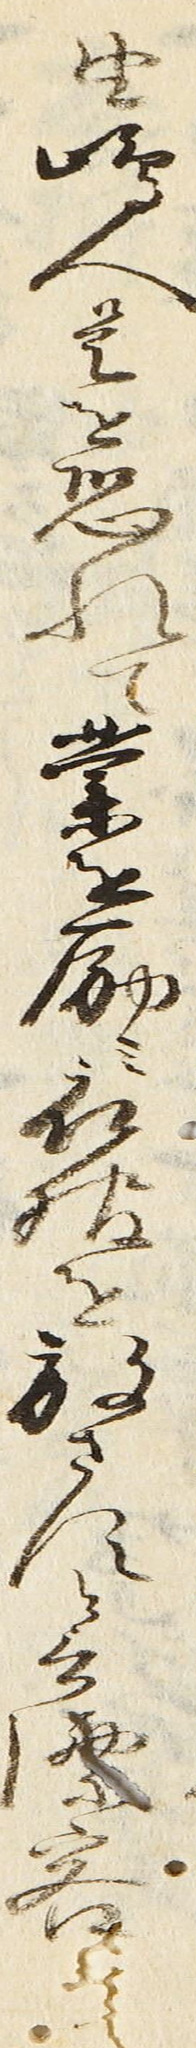由島人是を恐れて業を励ミ衣服を放さすと言漂客
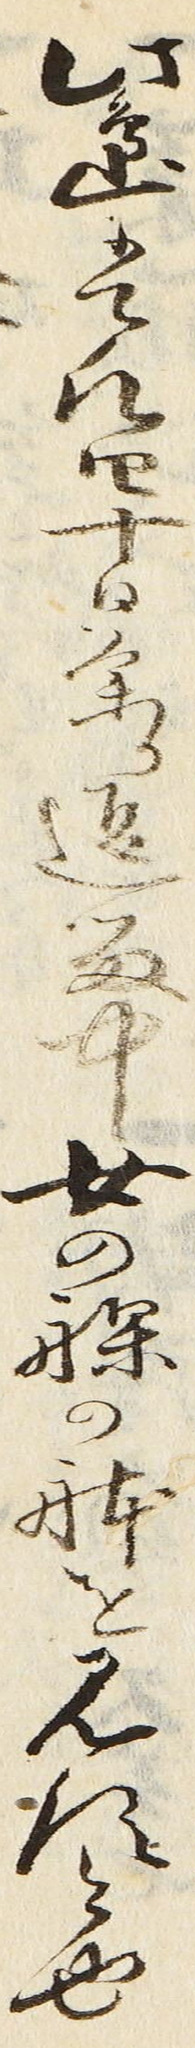此島にて凡四十日余り逗留中女の裸の体を見すと也
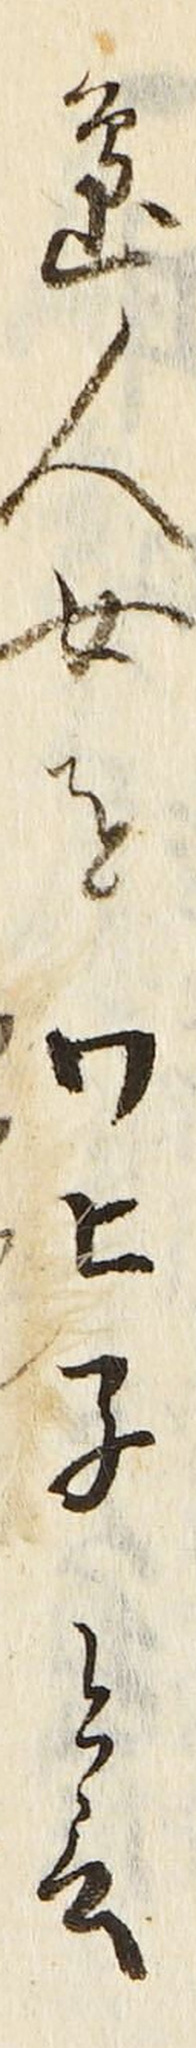島人女をワヒネと言
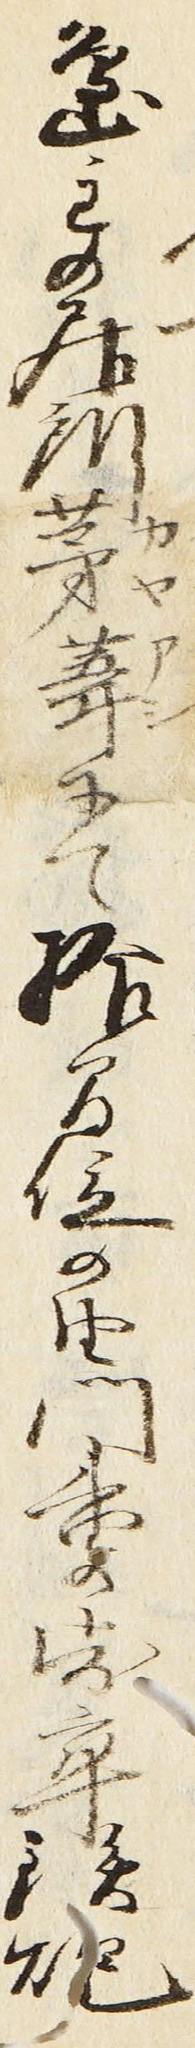島主の居所茅葦にて拾間位の由門番の歩卒鉄炮
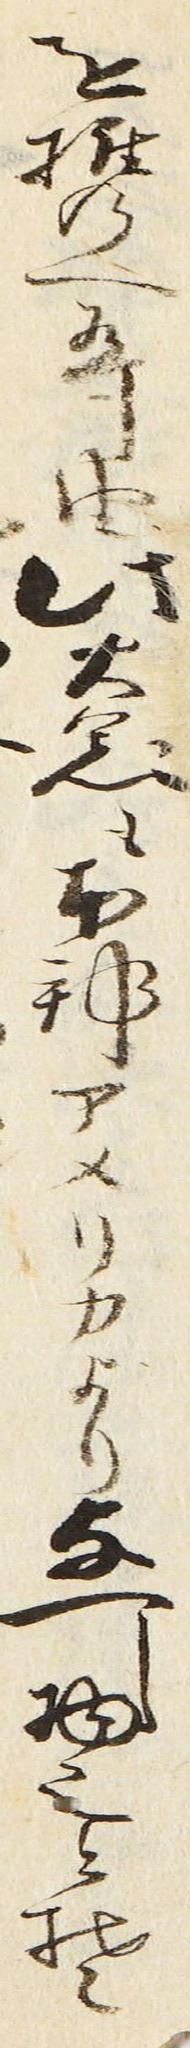を携へ有し由此火器も本邦アメリカより与へし物也とそ
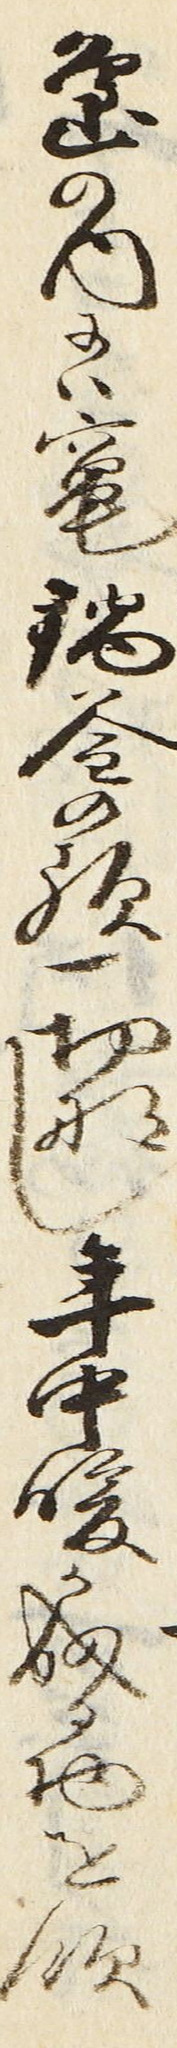島の内にハ竃鍋釜の類一切なし年中暖か成る物を飲
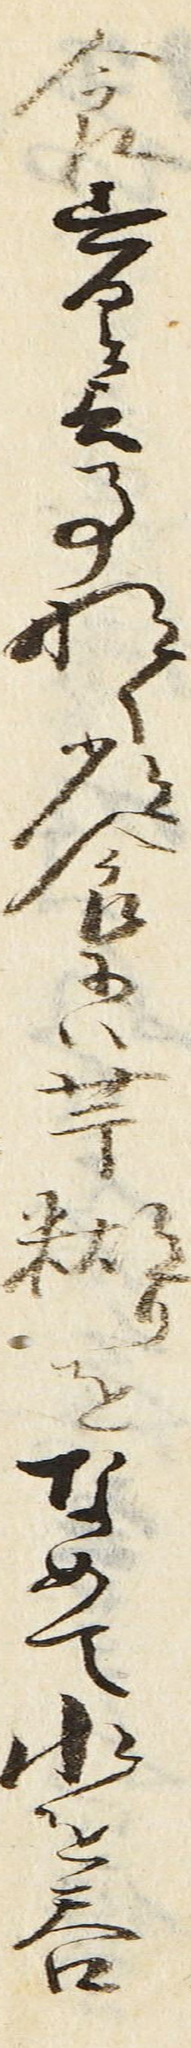食すると言事なく常食にハ芋糊りをなめて水を呑
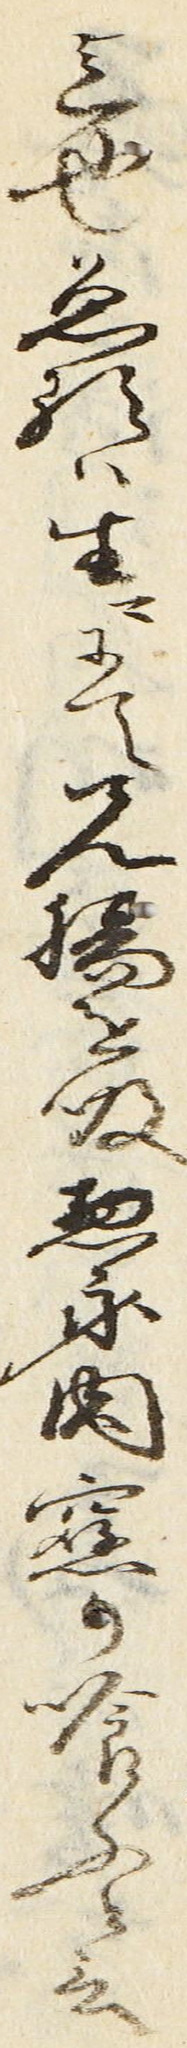迄也魚類ハ生マにて先腸を吸惣身肉り喰ふと言
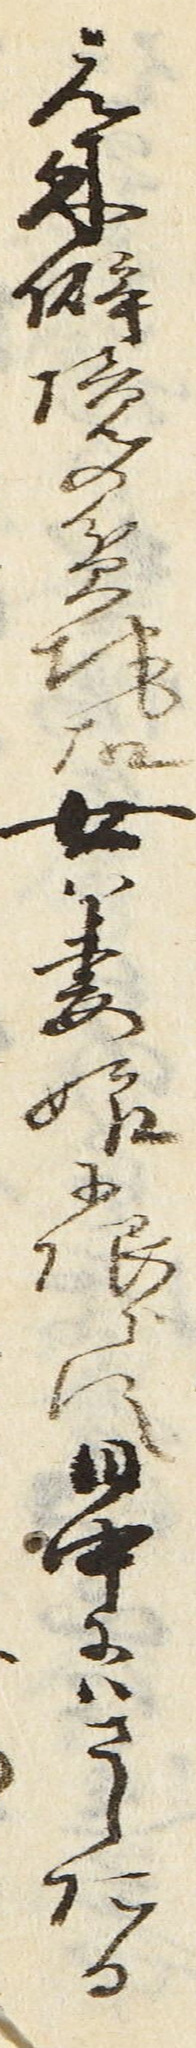元来僻境の貧地故女ハ妻娘に限らす日中にハさしたる
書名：亜墨利加漂流記聞
